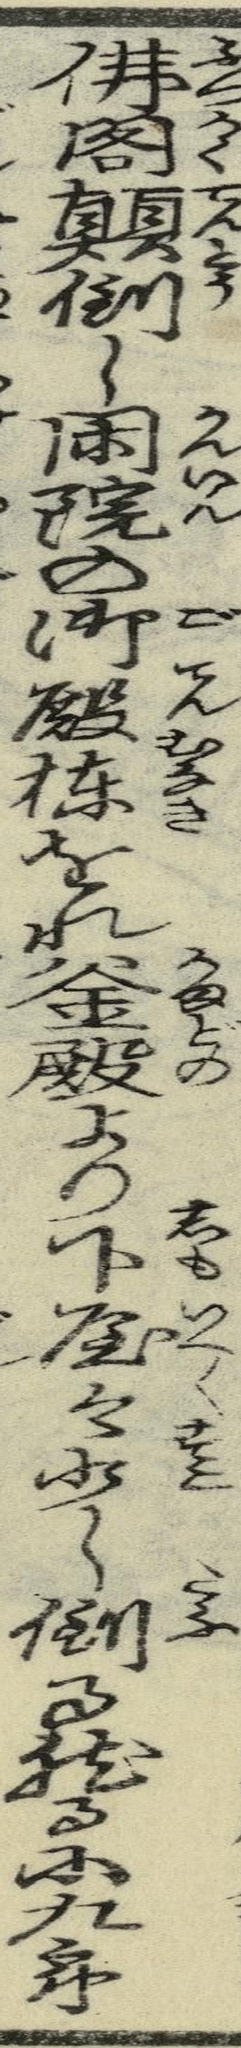佛閣顛倒し閑院の御殿棟をれ釜殿より下屋〻少し倒る然るに九郎
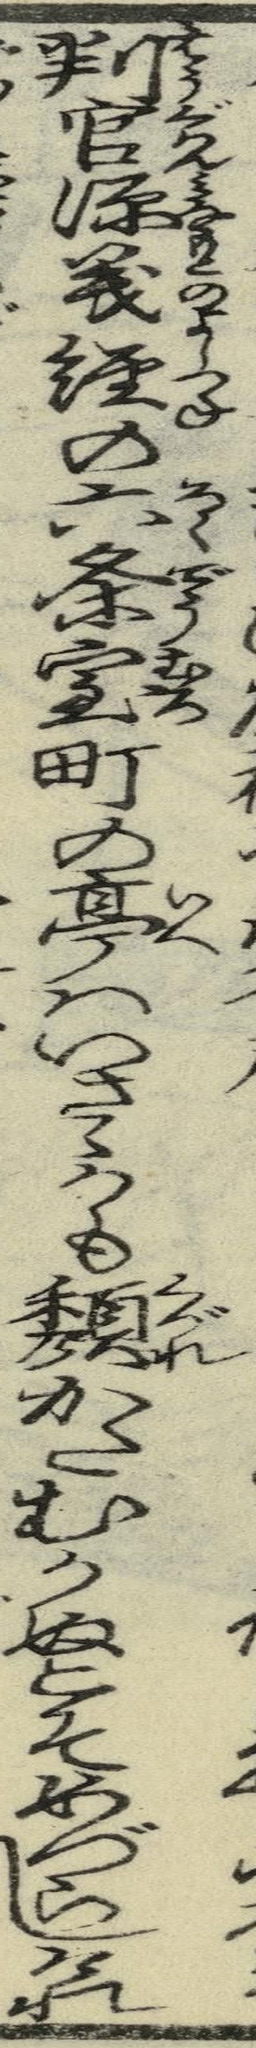判官源義経の六条室町の亭はいさヽかも頽かたむかぬとてめづらしけれ
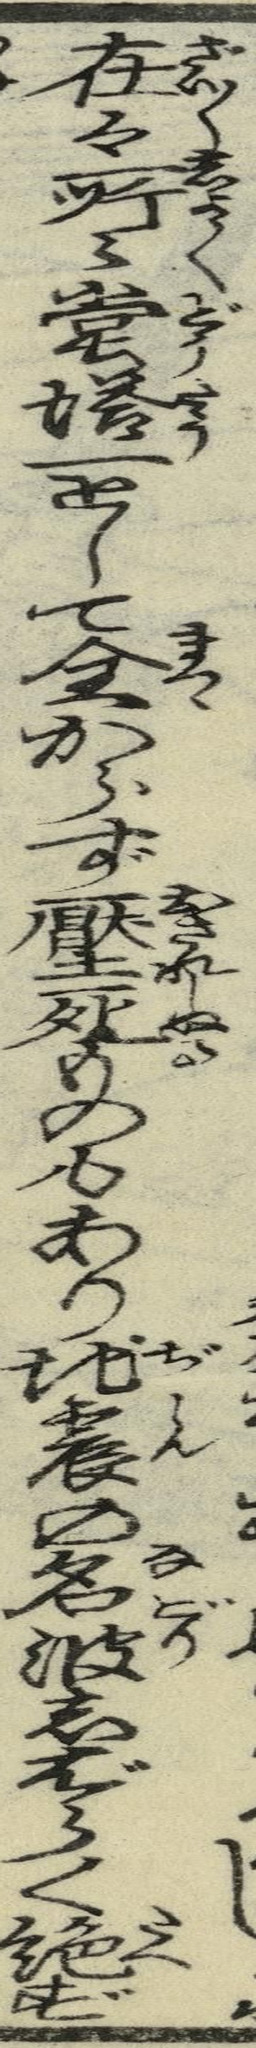在〻所〻堂塔一として全からず圧死ものもあり地震の名波しばらく絶ず
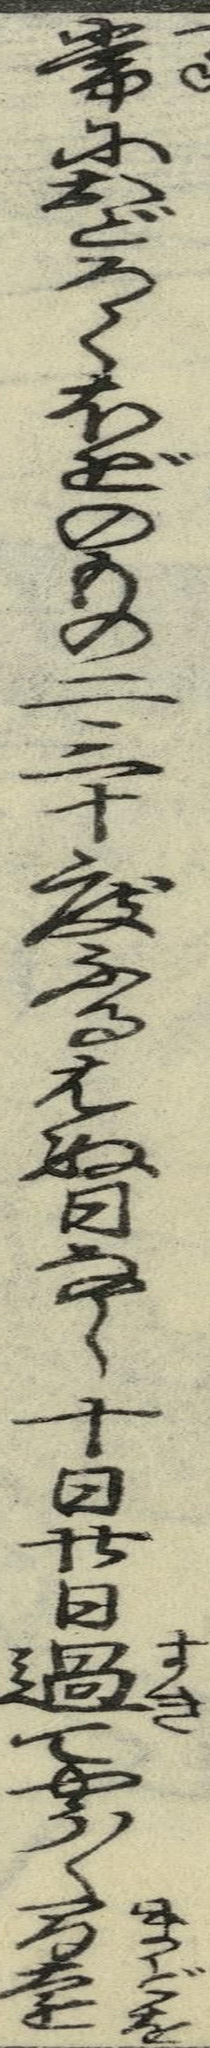常におどろくほどのもの二三十度ふるはぬ日なし十日廿日過てやう〳〵間遠
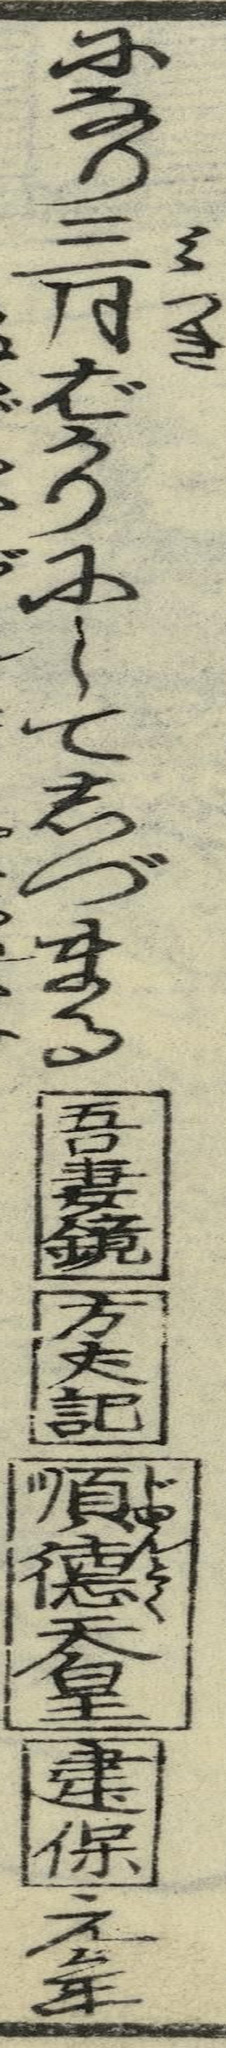になり三月ばかりにしてしづまる吾妻鏡方丈記順徳天皇建保元年
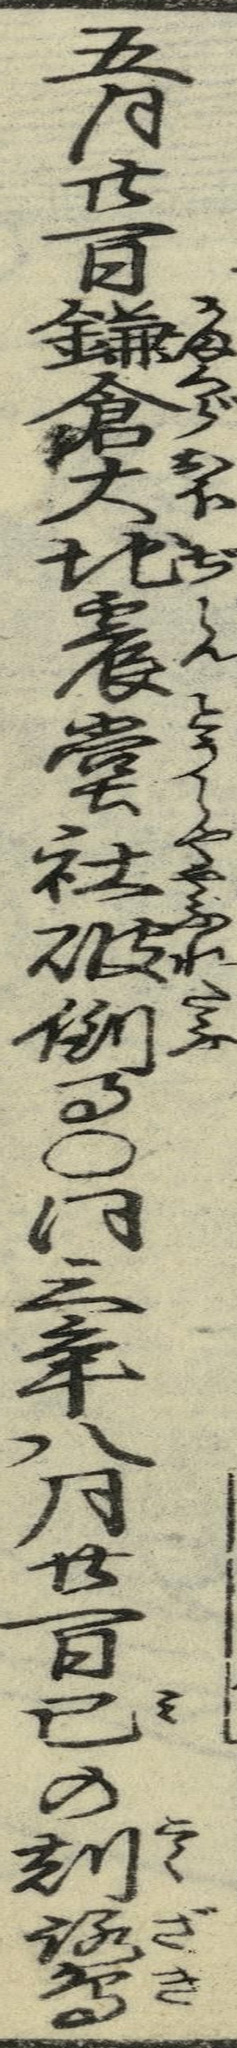五月廿一日鎌倉大地震堂社破倒る〇同三年八月廿一日巳の刻鷺

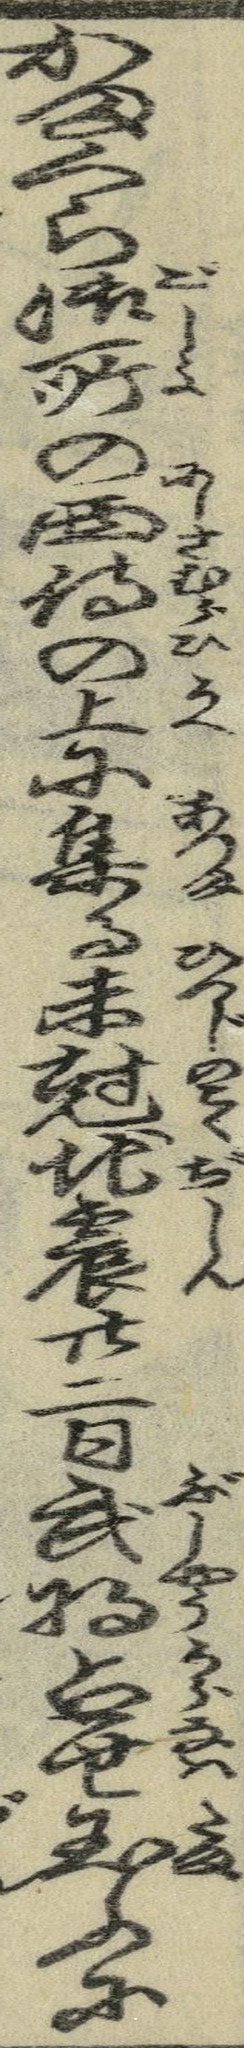かまくら御所の西侍の上に集る未尅地震廿二日武将占せ玉ふに
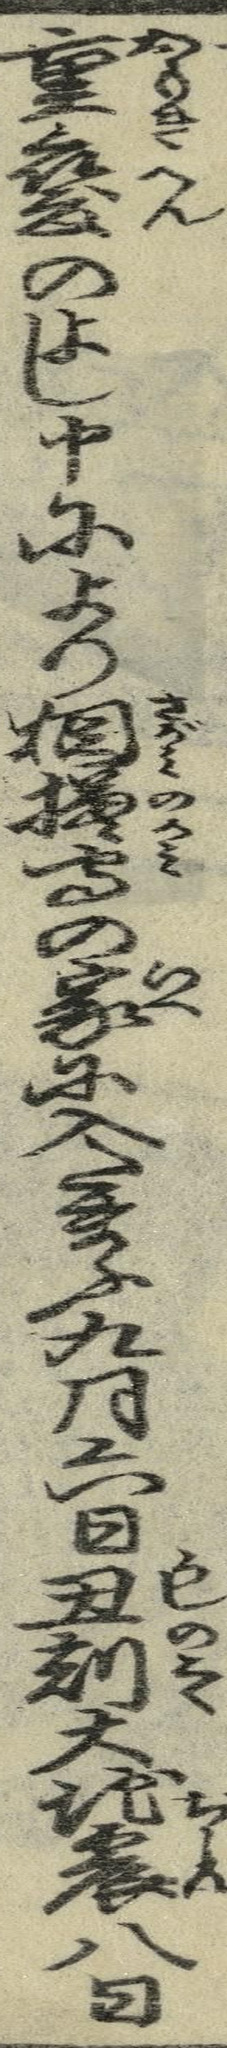重変のよし申により相模守の家に入たまふ九月六日丑刻大地震八日
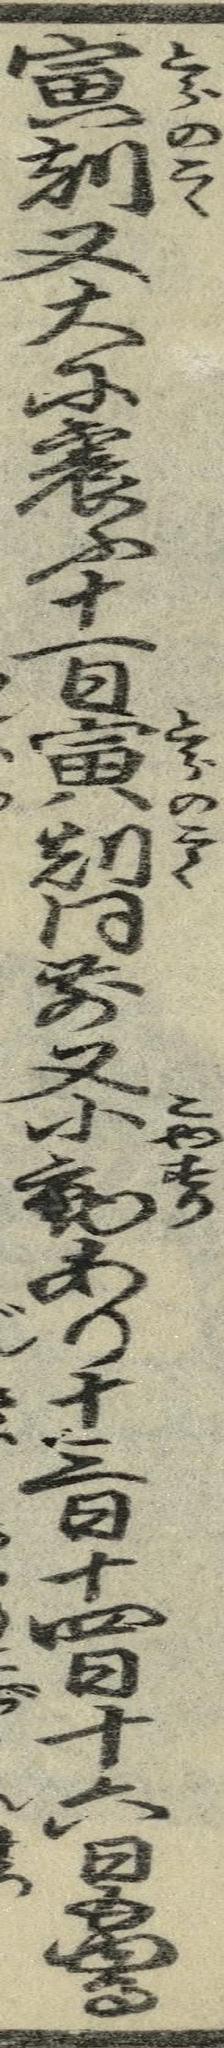寅刻又大に震ふ十一日寅刻同前又小動あり十三日十四日十六日もゆる
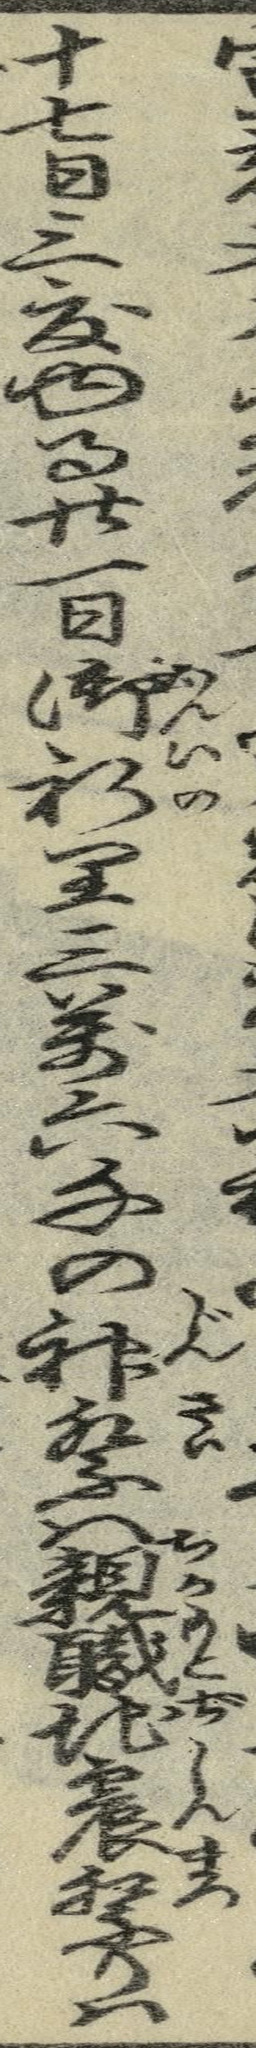十七日三度ゆる廿一日御祈り三万六千の神祭は親職地震祭りは
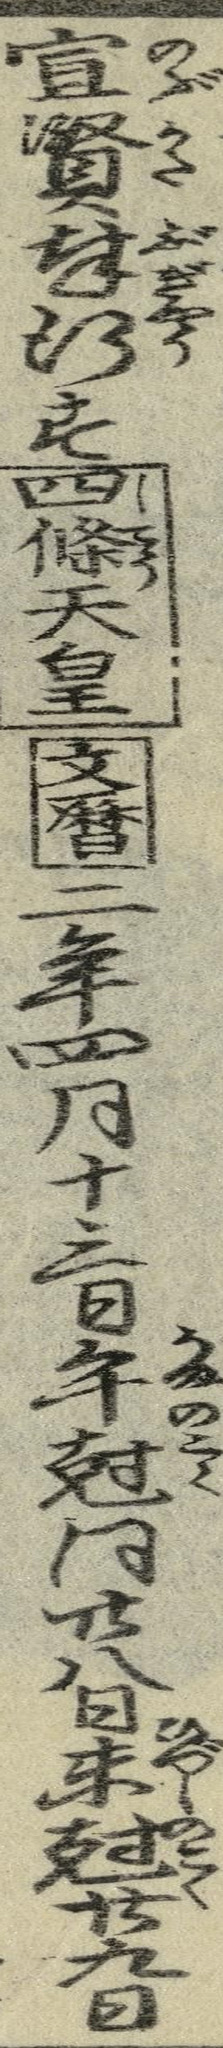宣賢奉行す四條天皇文暦二年四月十三日午尅同廿八日未尅廿九日
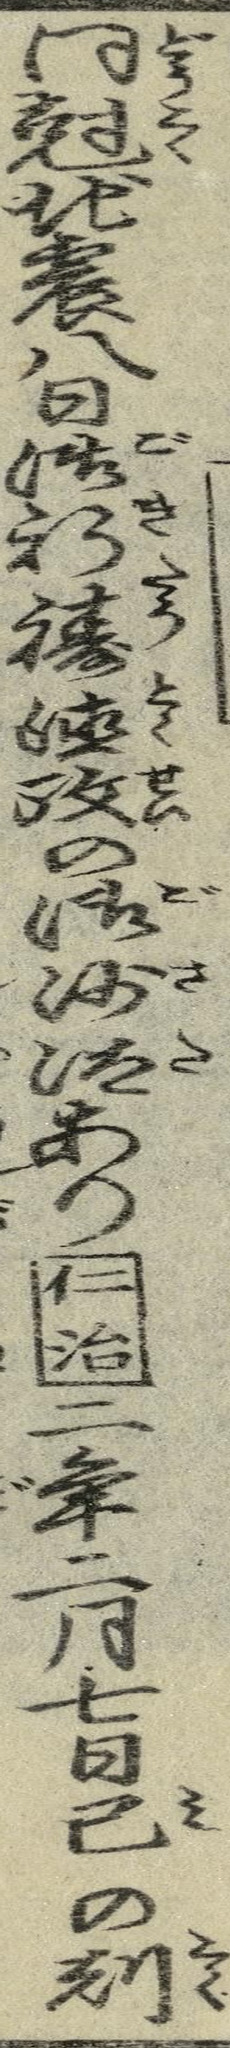同尅地震八日御祈祷徳政の御沙汰あり仁治二年二月七日巳の刻
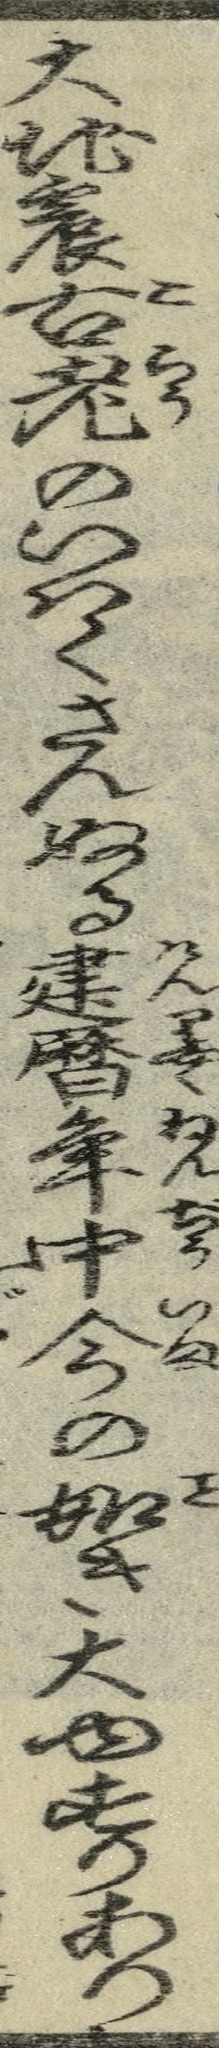大地震古老のいはくさんぬる建暦年中今の如き大ゆすりあり
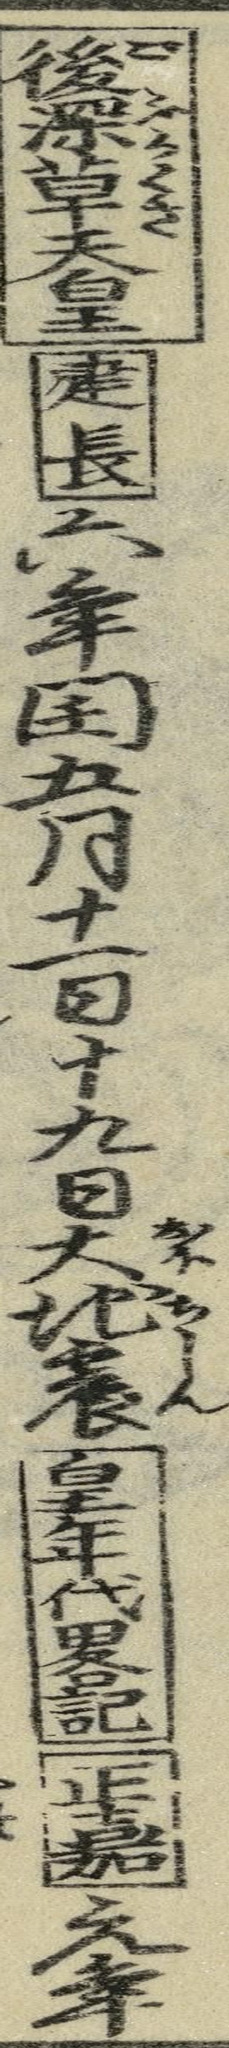後深草天皇建長六年閏五月十一日十九日大地震皇年代略記正嘉元年
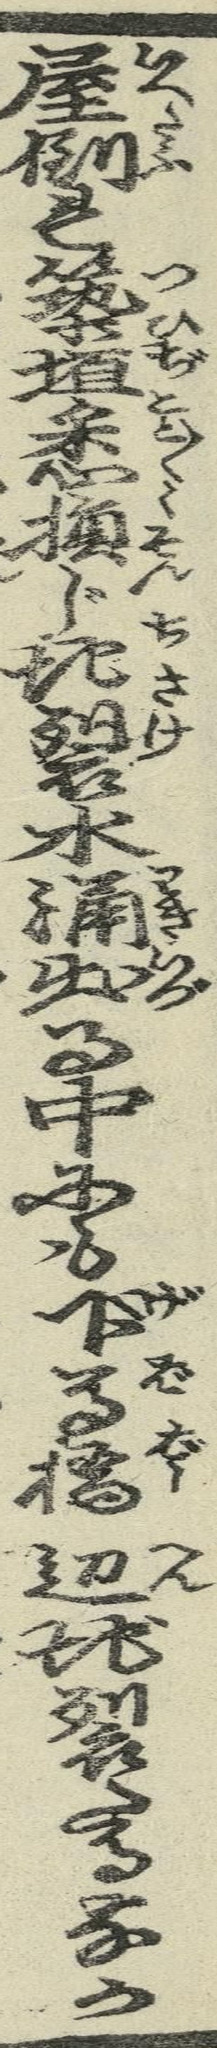屋倒れ築垣悉損じ地裂水湧出る中にも下馬橋辺地裂たるなか
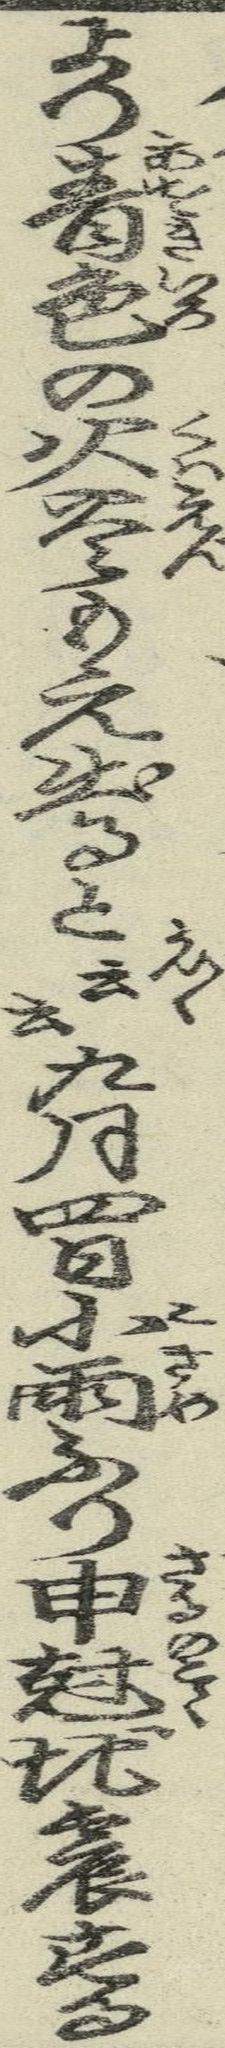より青色の火炎もえ出ると云云九月四日小雨ふり申尅地震する
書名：地震年代記
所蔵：東京大学地震研究所図書室 Earthquake Research Institute Library, The University of Tokyo, JAPAN
